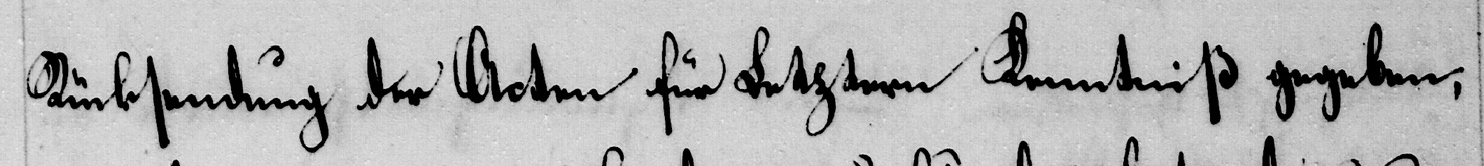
Rücksendung der Acten für Letztern Kenntniß gegeben,
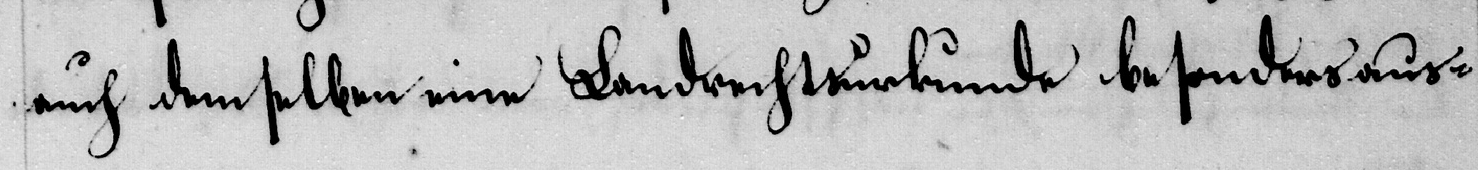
auch demselben eine Landrechtsurkunde besonders aus¬
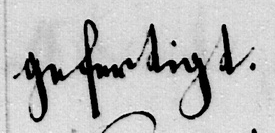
gefertigt.
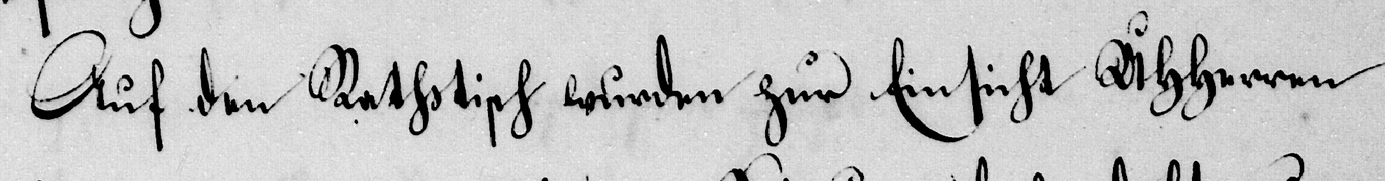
Auf den Rathstisch wurden zur Einsicht UHHerren
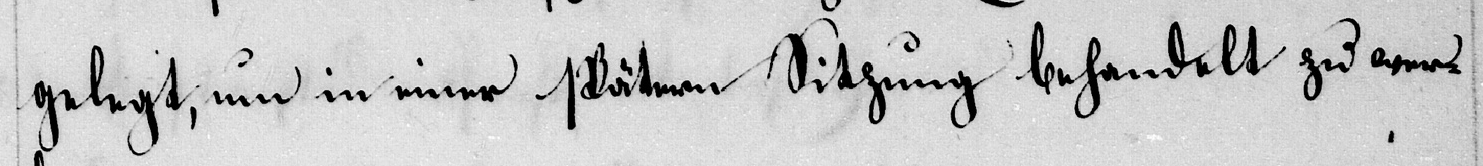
gelegt, um in einer spätern Sitzung behandelt zu wer¬
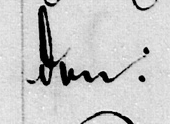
den:
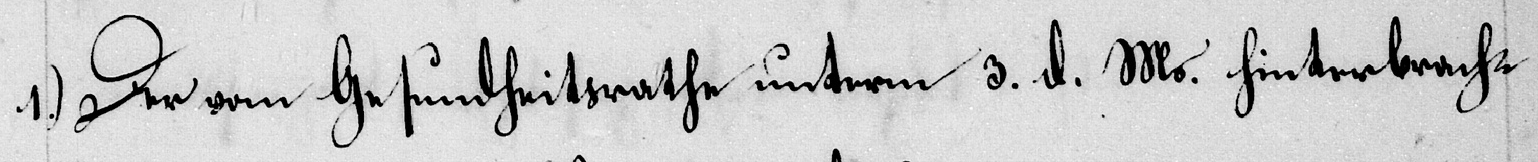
1.) Der vom Gesundheitsrathe unterm 3. d. Ms. hinterbrach¬
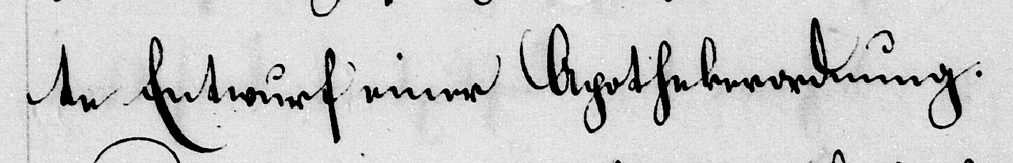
te Entwurf einer Apothekerordnung.
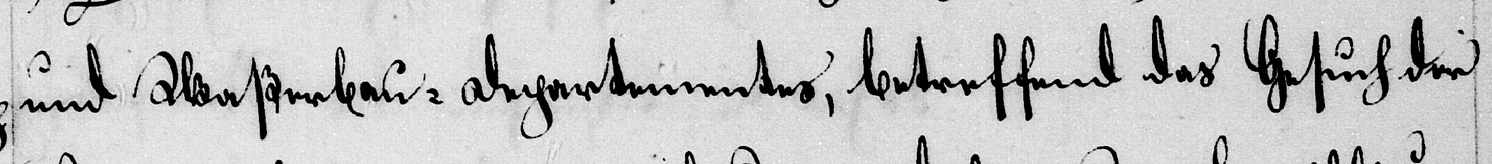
und Waßerbau-Departementes, betreffend das Gesuch der
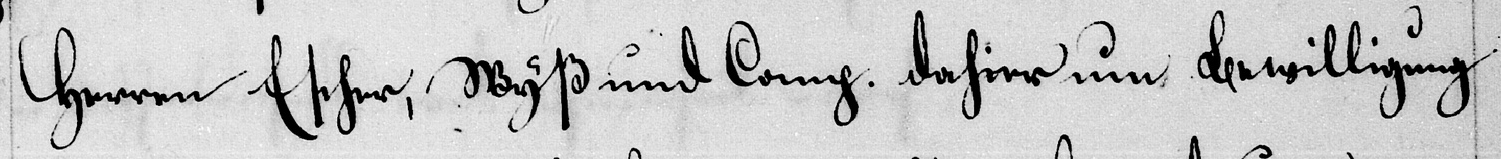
Herren Escher, Wyß und Comp. dahier um Bewilligung
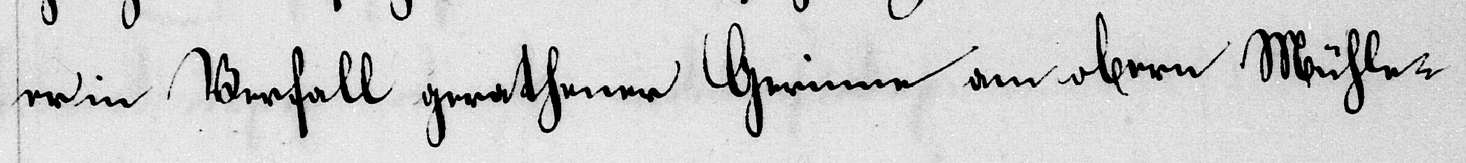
er in Verfall gerathener Gerinne am obern Mühle¬
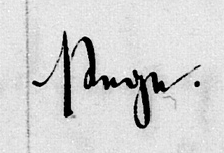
stege.
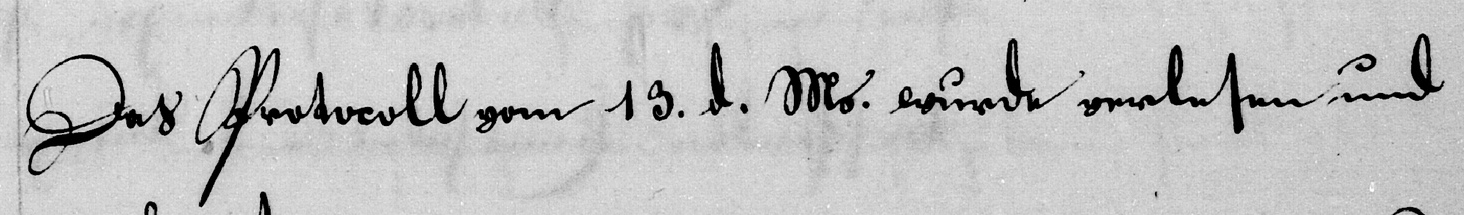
Das Protocoll vom 13. d. Ms. wurde verlesen und
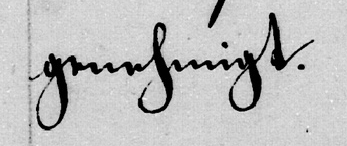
genehmigt.
